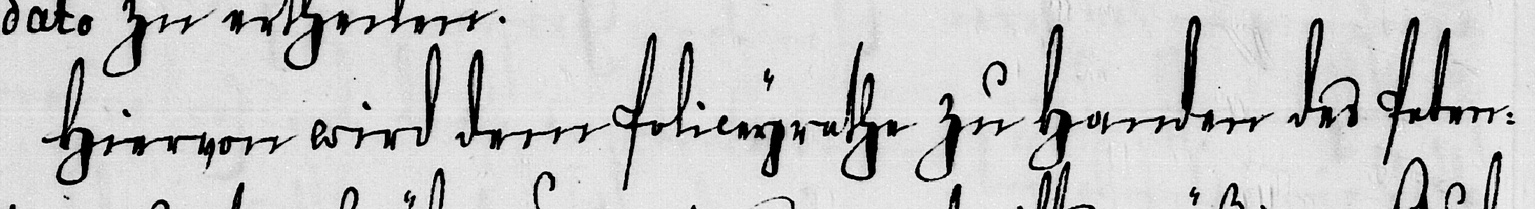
Hiervon wird dem Policeyrathe zu Handen des Peten¬
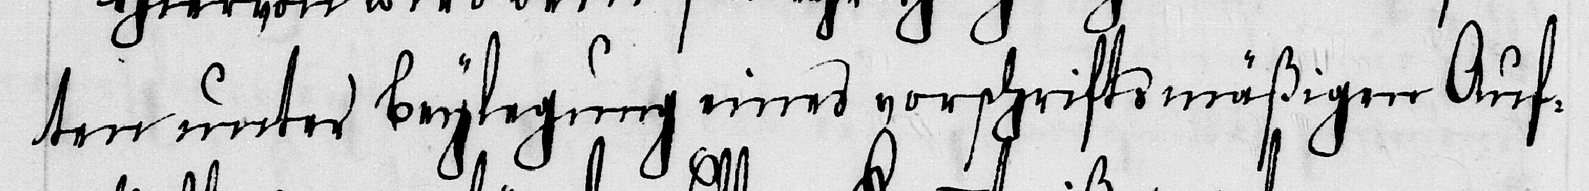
ten unter Beylegung eines vorschriftsmäßigen Auf¬
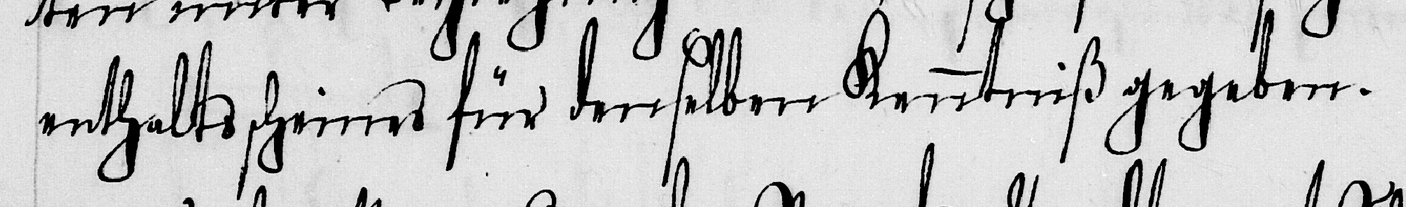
enthaltsscheines für denselben Kenntniß gegeben.
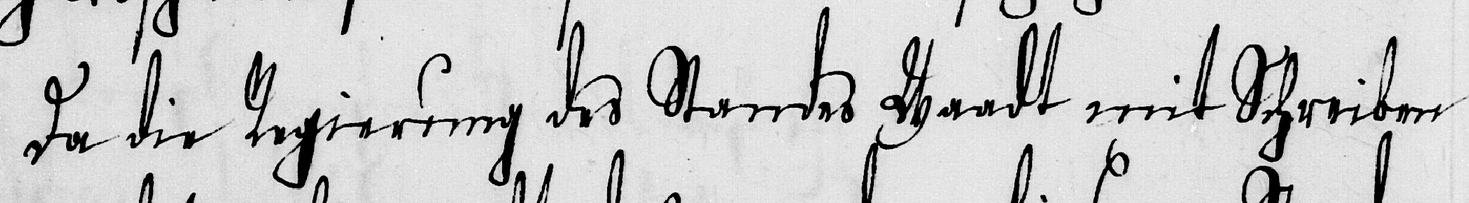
Da die Regierung des Standes Waadt mit Schreiben
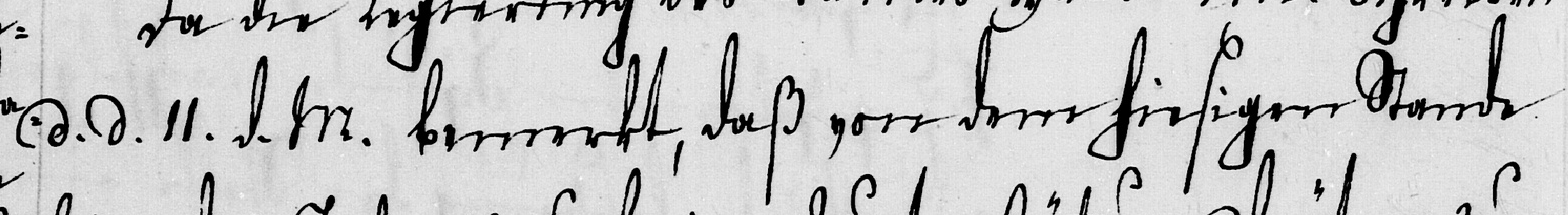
d. 11. d. M. bemerkt, daß von dem hiesigen Stande
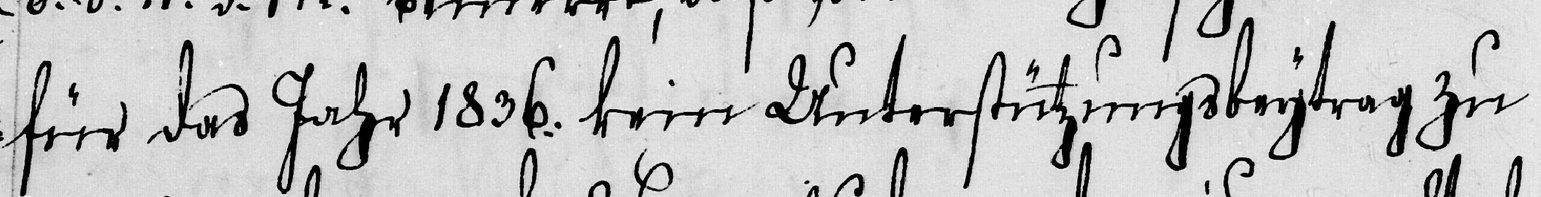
für das Jahr 1836. kein Unterstützungsbeytrag zu
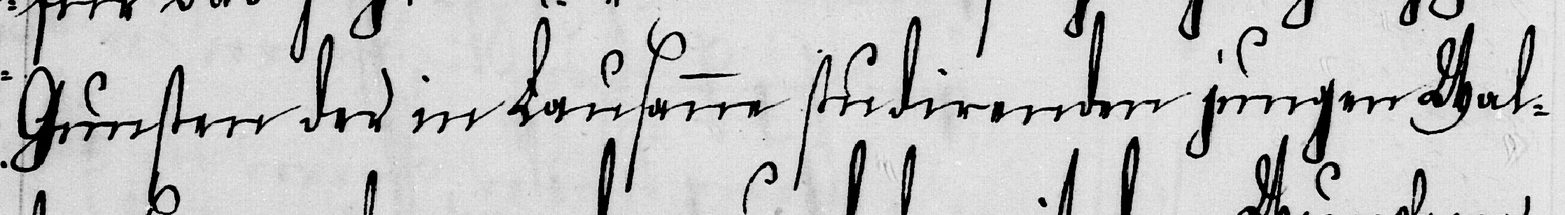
Gunsten der in Lausanne studirenden jungen Wal¬
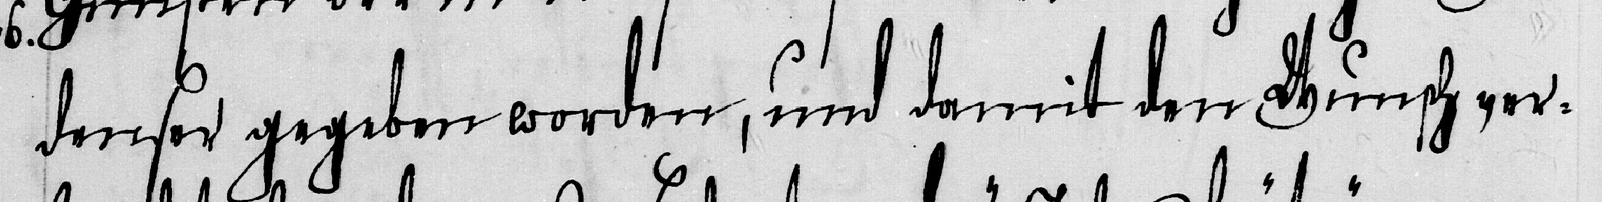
denser gegeben worden, und damit den Wunsch ver¬
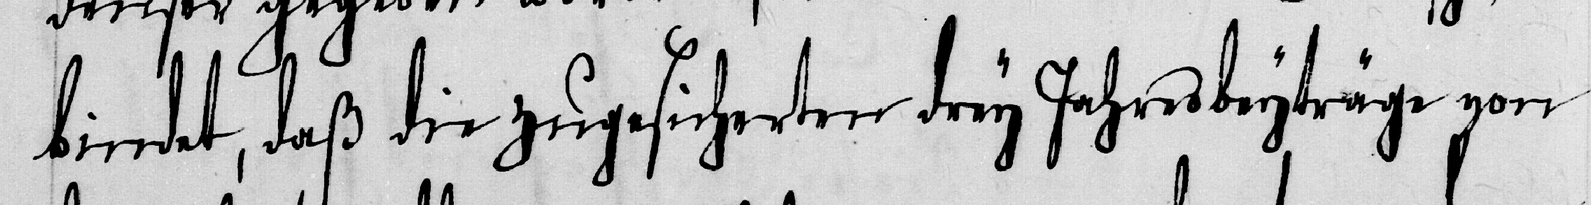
bindet, daß die zugesicherten drey Jahresbeyträge von
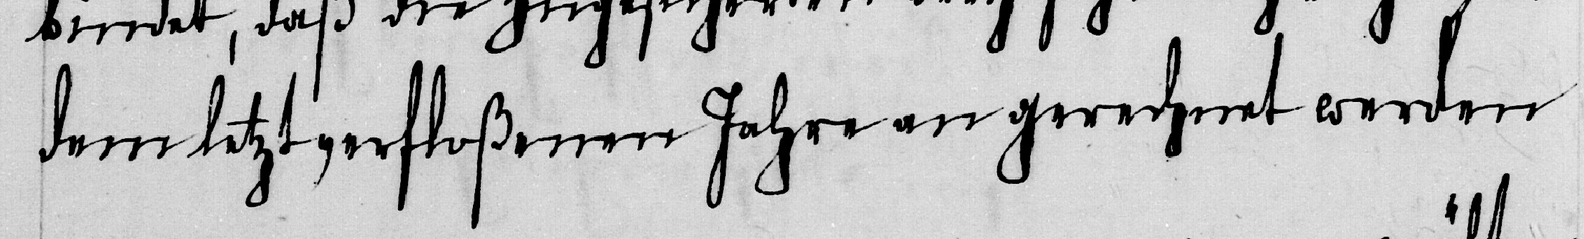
dem letztverfloßenen Jahre an gerechnet werden
